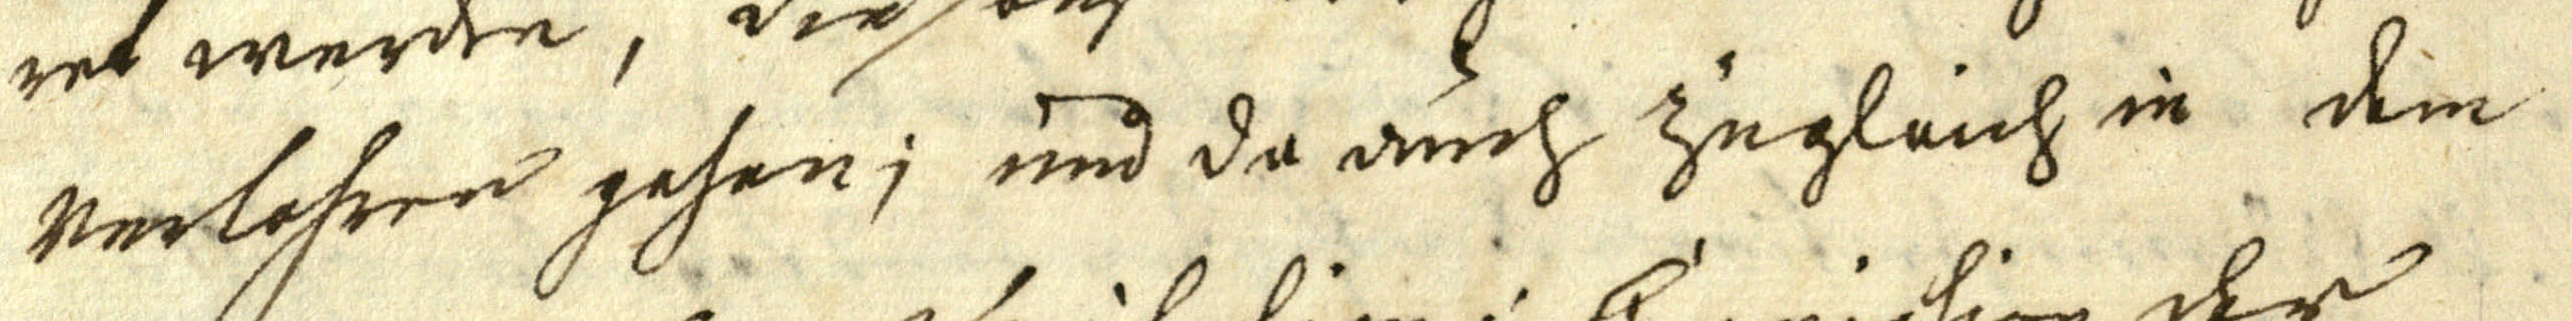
verlohren gehen; und da auch zugleich in dem
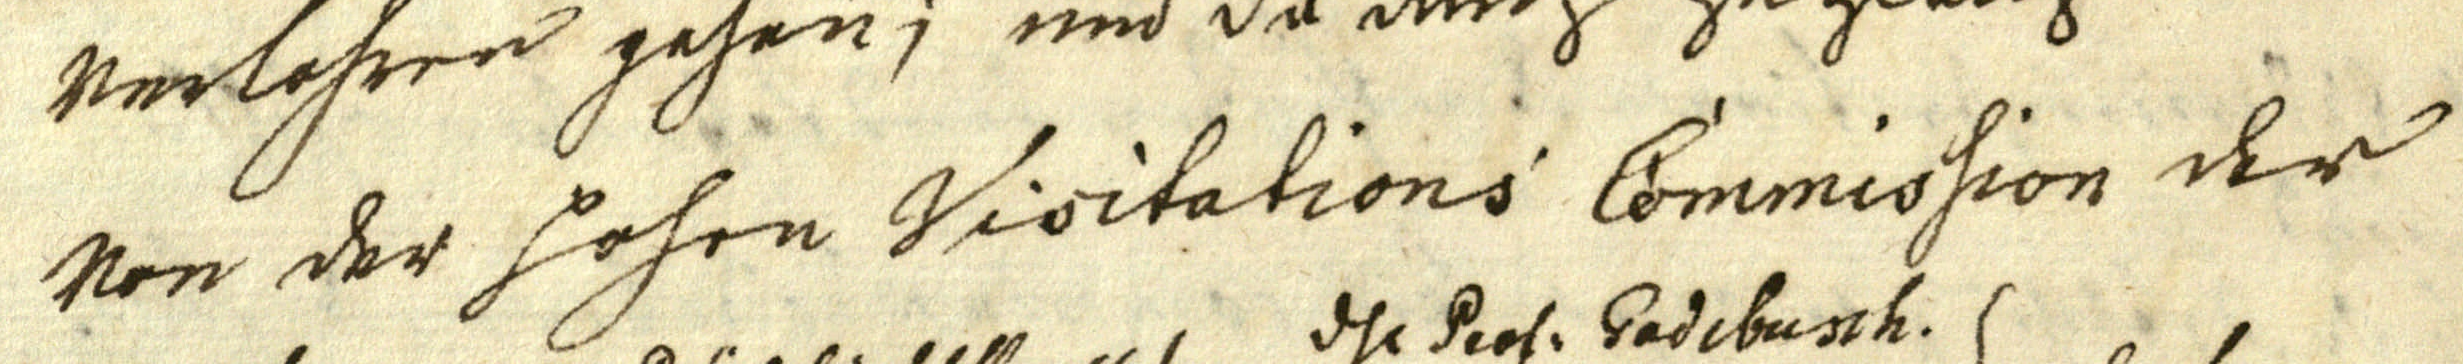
von der hohen Visitations Commission der
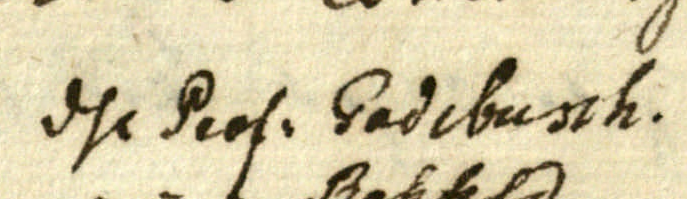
dh Prof. Gadebusch¬
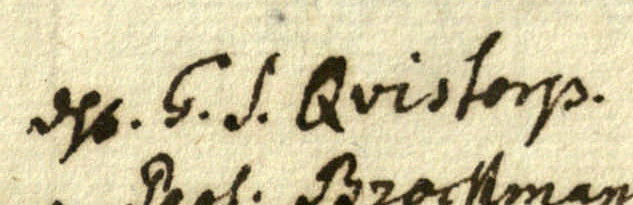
dh. G. J. Quistorp.
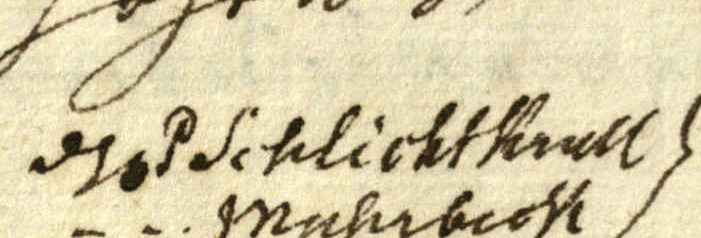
dh P Schlichtkrull
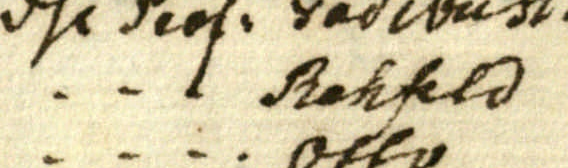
Rehfeld
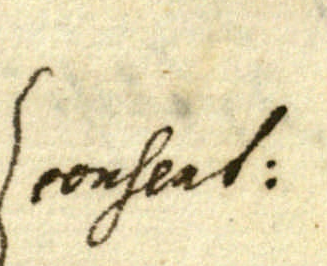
consent
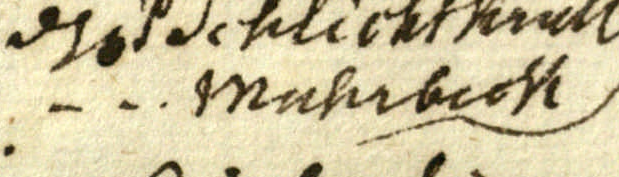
Muhrbeck
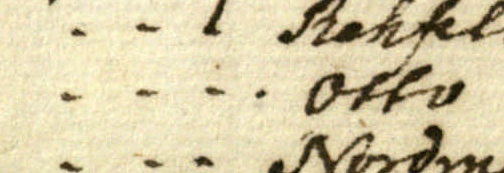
Otto
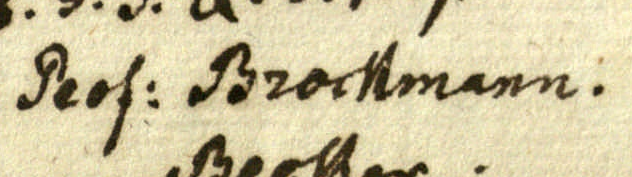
Prof. Brockmann.
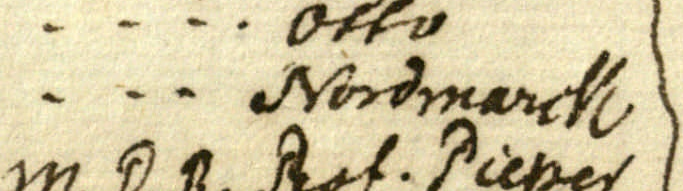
Nordmarck,
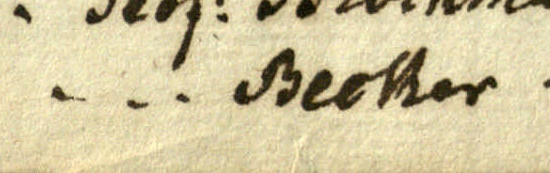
Becker
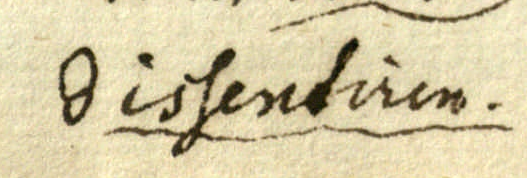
dissentiren.
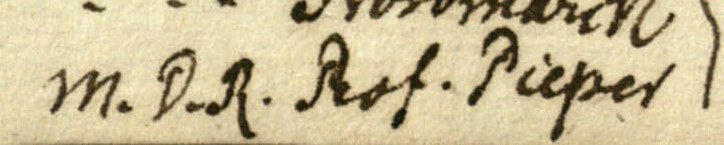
M. D. R. Prof. Pieper
